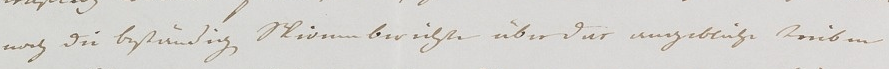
noch die beständigen Spionenberichte über das angebliche Treiben
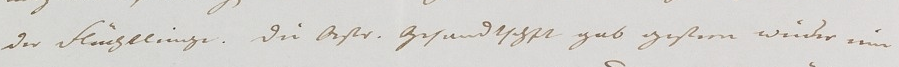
der Flüchtlinge. Die Oestr. Gesandtschft gab gestern wieder eine
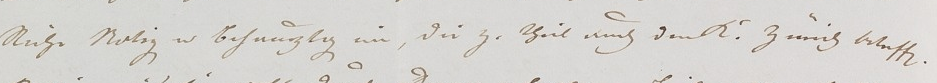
Reihe Notizen u Behauptgen ein, die z. Theil auch den K. Zürich betreffen.
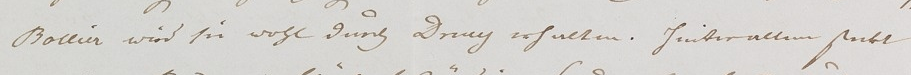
Bollier wird sie wohl durch Druey erhalten. Hinter allem steckt
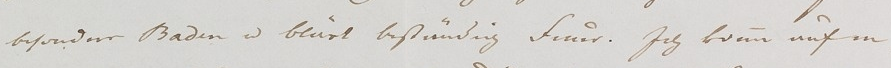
besonders Baden u bläst beständig Feuer. Ich komme auf m.
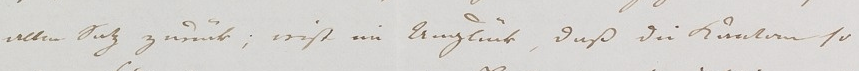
alten Satz zurück; es ist ein Unglück, daß die Kantone so
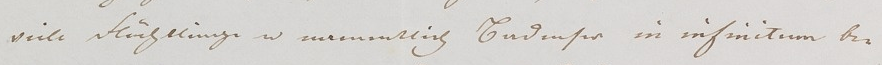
viele Flüchtlinge u namentlich Badenser in infinitum be-
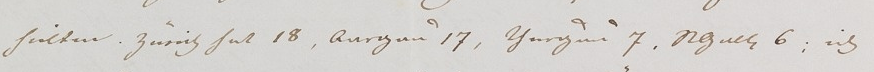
hielten. Zürich hat 18, Aargau 17, Thurgau 7, St Gallen 6; ich
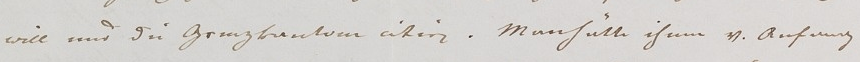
will nur die Grenzkantone citiren. Man hätte ihnen v. Anfang
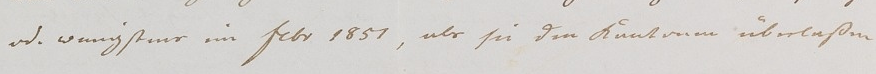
od. wenigstens im Febr 1851, als sie den Kantonen überlaßen
